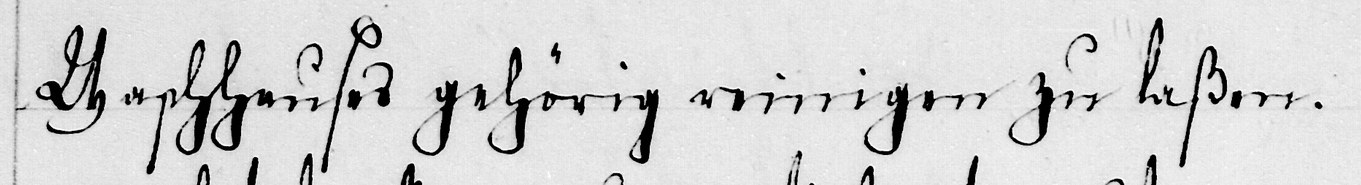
Waschhauses gehörig reinigen zu laßen.
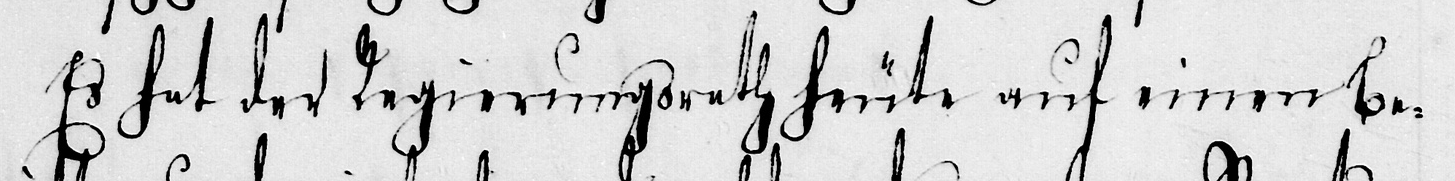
Es hat der Regierungsrath heute auf einen Be¬
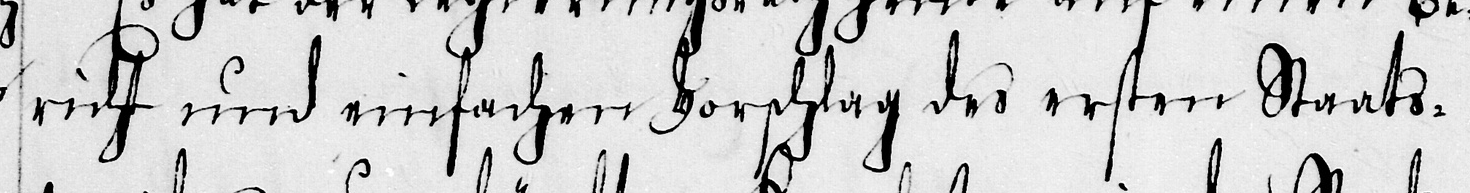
richt und einfachen Vorschlag des ersten Staats¬
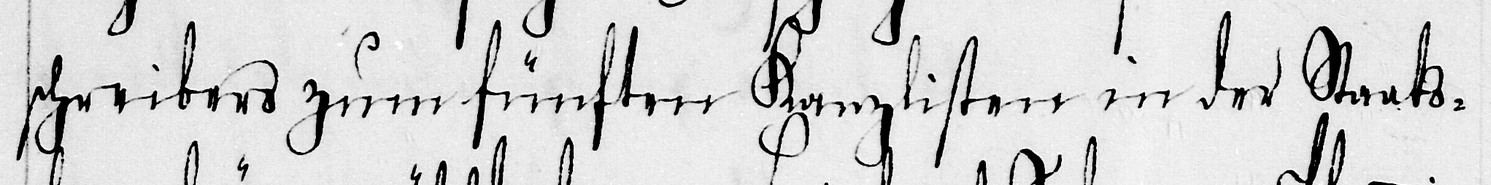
schreibers zum fünften Kanzlisten in der Staats¬
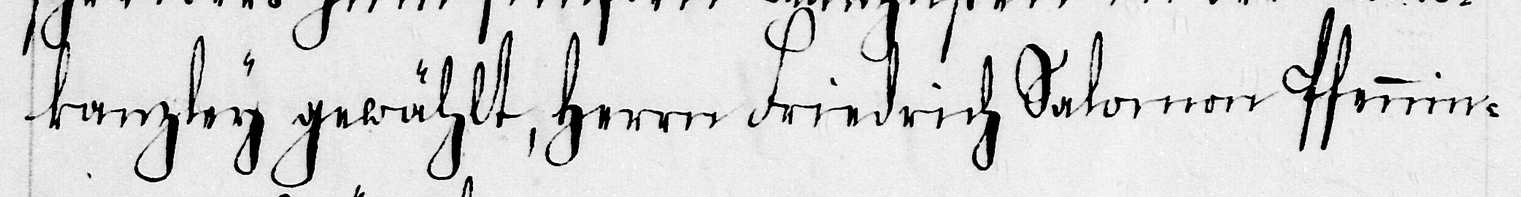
kanzley gewählt, Herrn Friedrich Salomon Pfennin¬
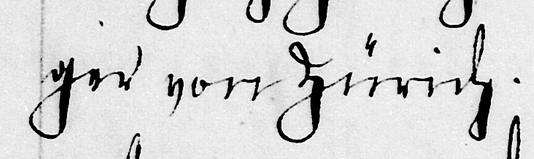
ger von Zürich.
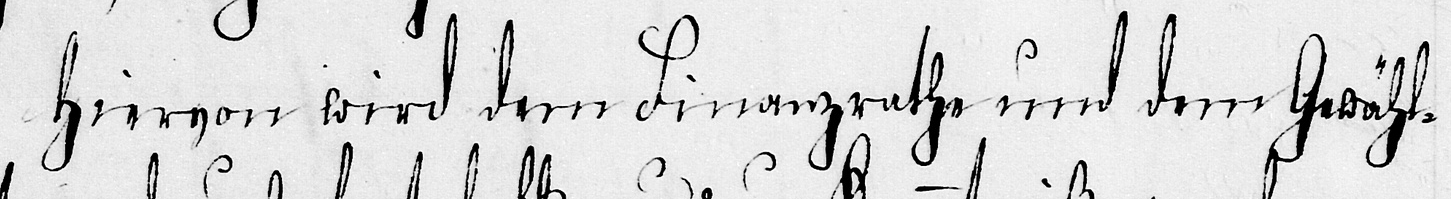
Hiervon wird dem Finanzrathe und dem Gewähl¬
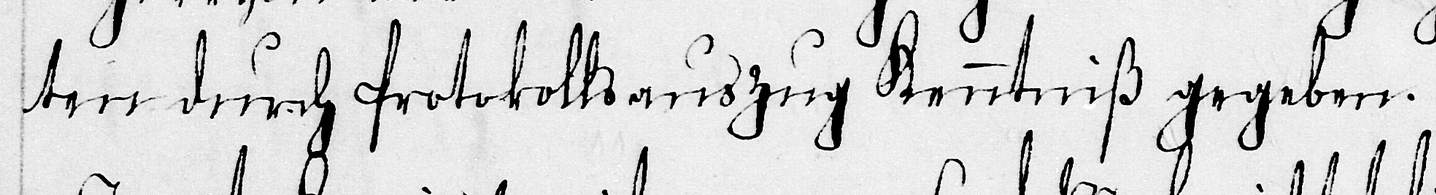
ten durch Protokollsauszug Kenntniß gegeben.
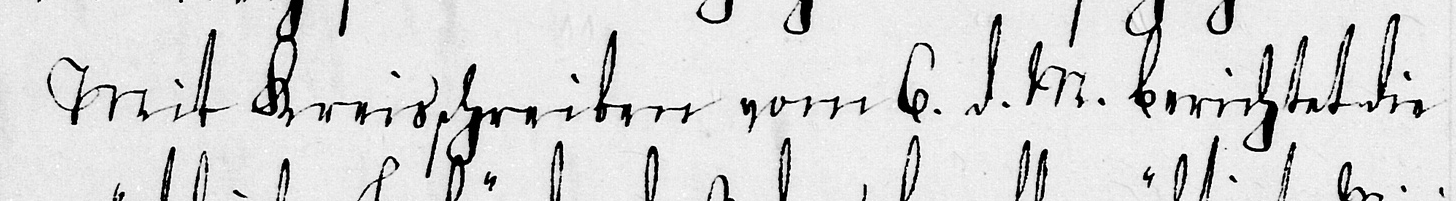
Mit Kreisschreiben vom 6. d. M. berichtet die
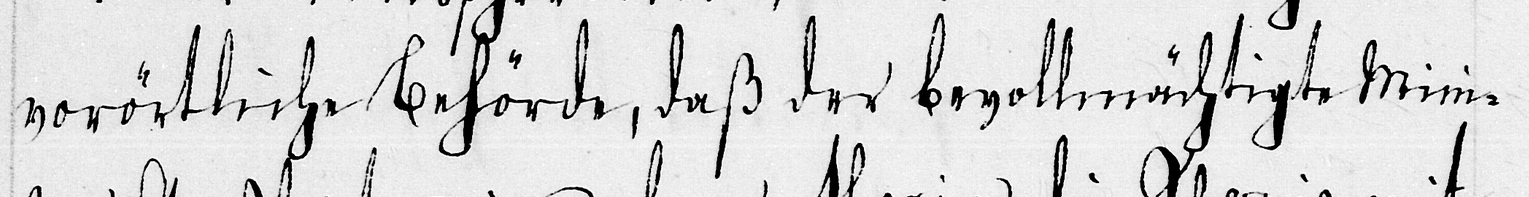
vorörtliche Behörde, daß der bevollmächtigte Mini¬
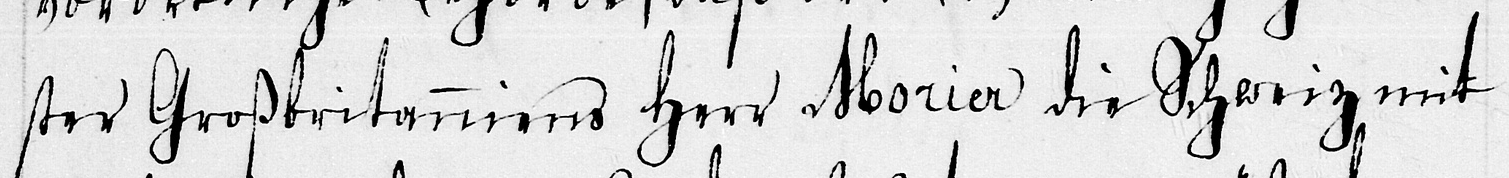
ster Großbritanniens Herr Morier die Schweiz mit
